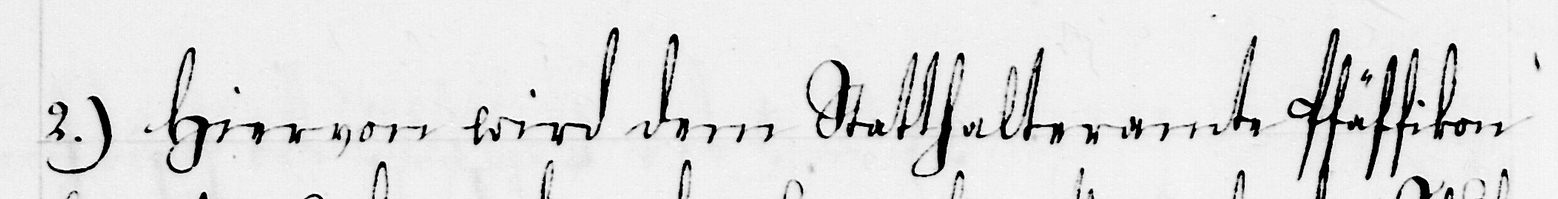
2.) Hiervon wird dem Statthalteramte Pfäffikon
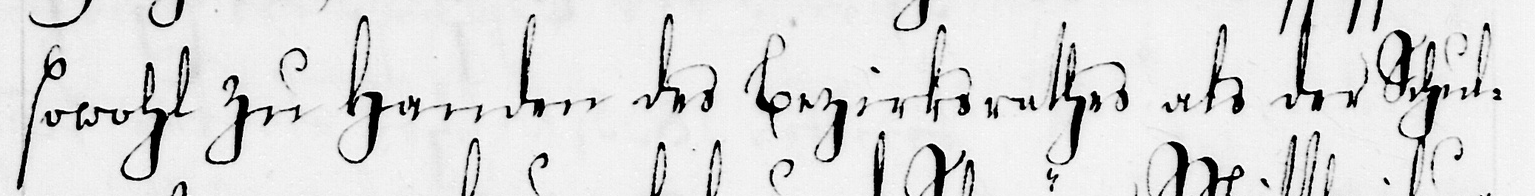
sowohl zu Handen des Bezirksrathes als der Schul¬
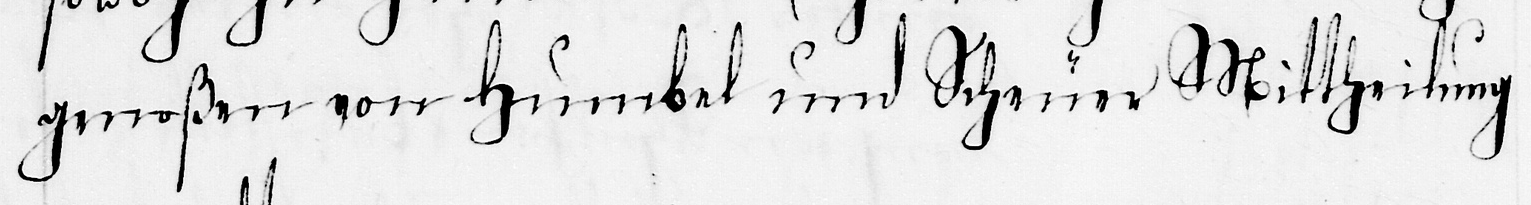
genoßen von Humbel und Scheuer Mittheilung
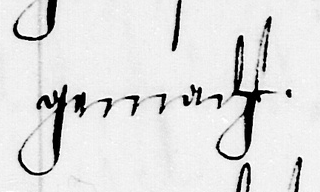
gemacht.
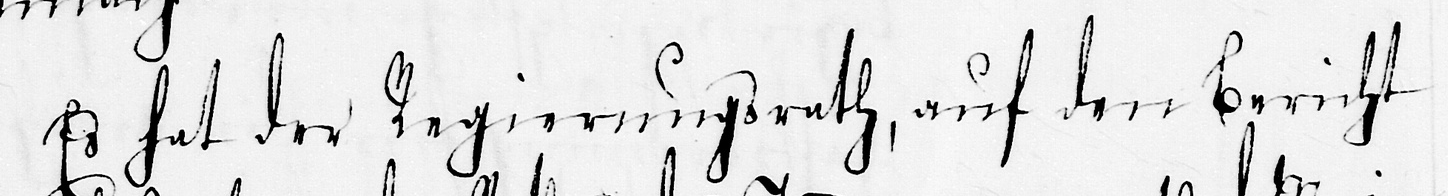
Es hat der Regierungsrath, auf den Bericht
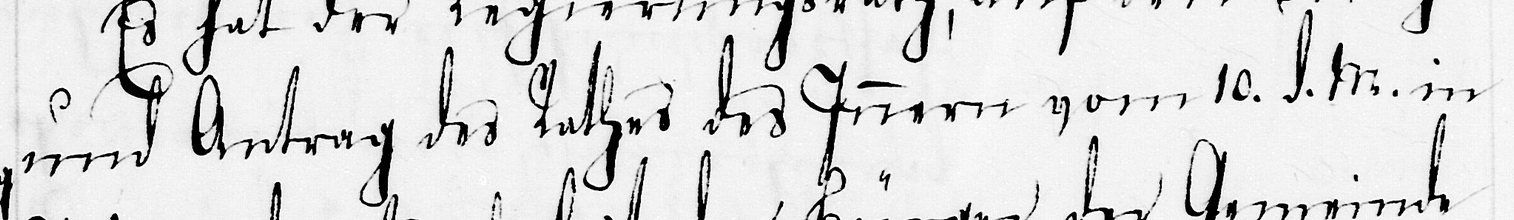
und Antrag des Rathes des Innern vom 10. d. M. in
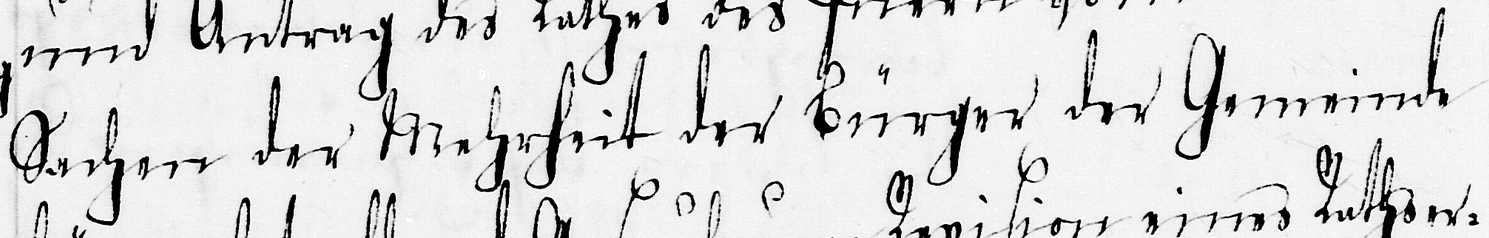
Sachen der Mehrheit der Bürger der Gemeinde
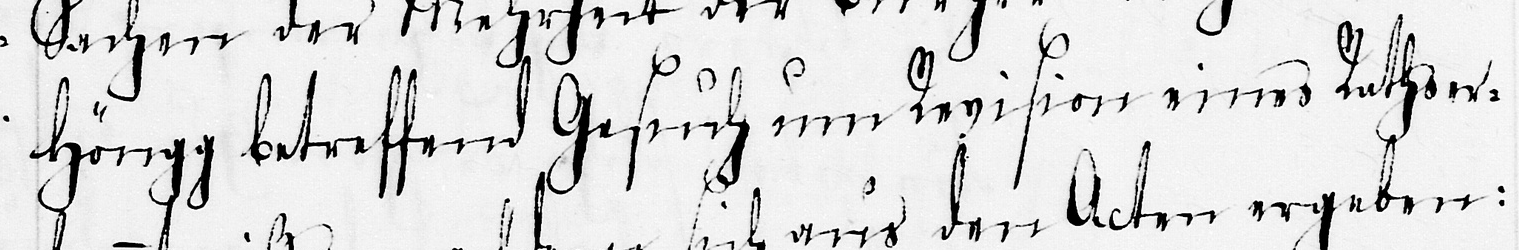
Höngg betreffend Gesuch um Revision eines Rathser¬
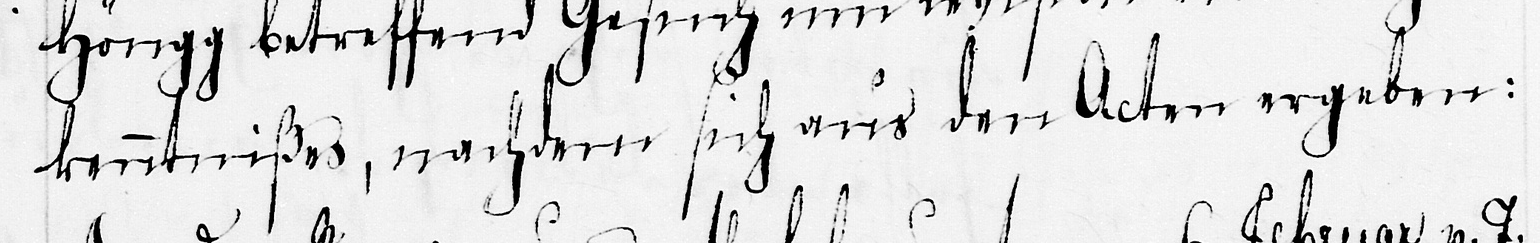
kenntnißes, nachdem sich aus den Acten ergeben:
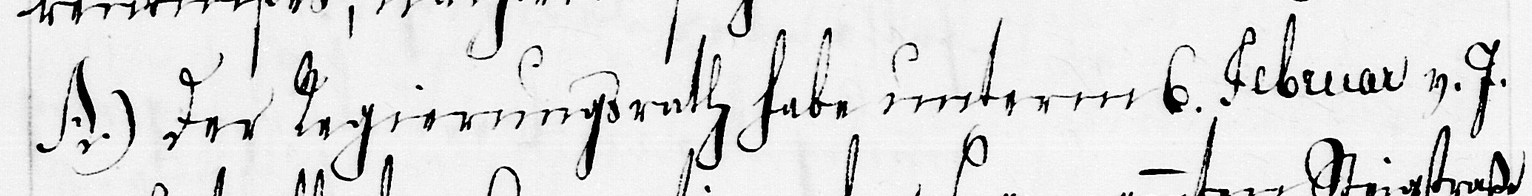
A.) Der Regierungsrath habe unterm 6. Februar v. J.
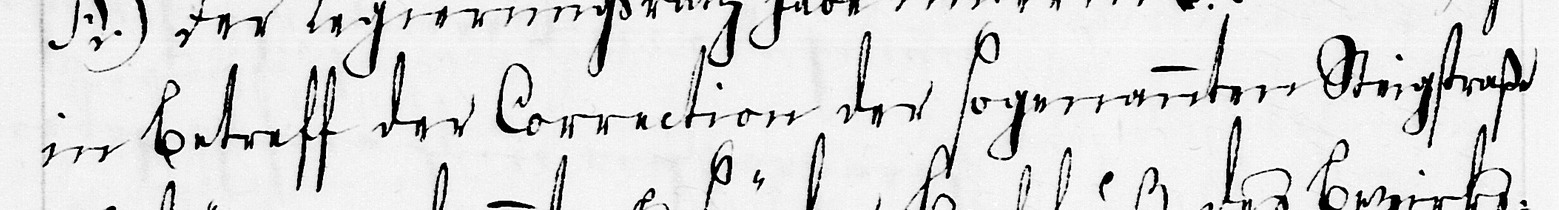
in Betreff der Correction der sogenannten Steigstraße
